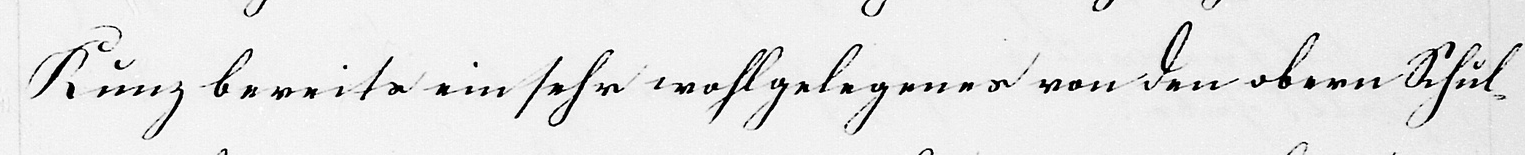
Kunz bereits ein sehr wohlgelegenes von den obern Schul¬
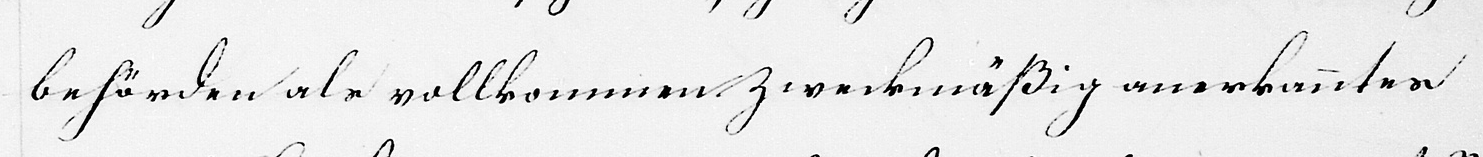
behörden als vollkommen zweckmäßig anerkanntes
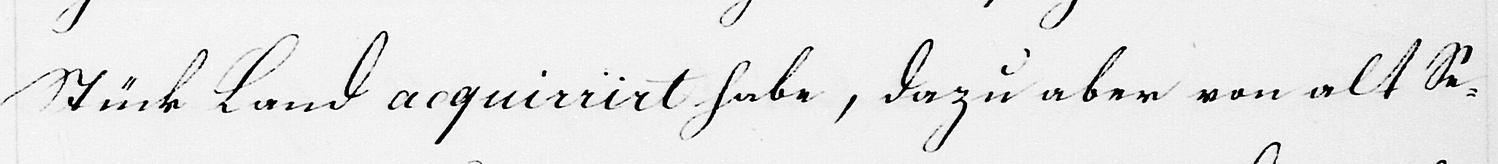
Stück Land acquirrirt habe, dazu aber von alt Se¬
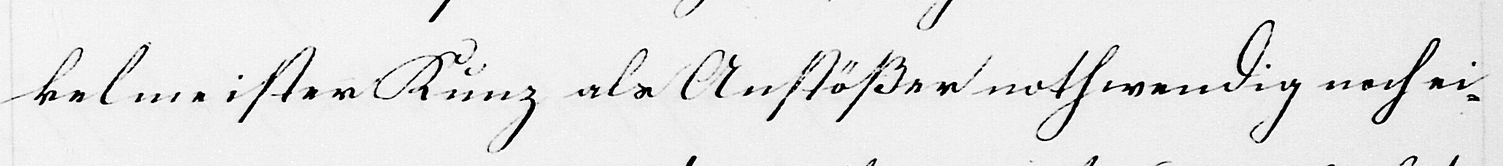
kelmeister Kunz als Anstößer nothwendig noch ei¬
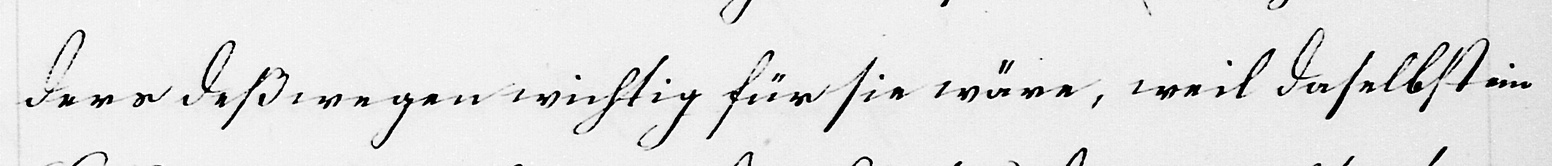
ders deßwegen wichtig für sie wäre, weil daselbst ein
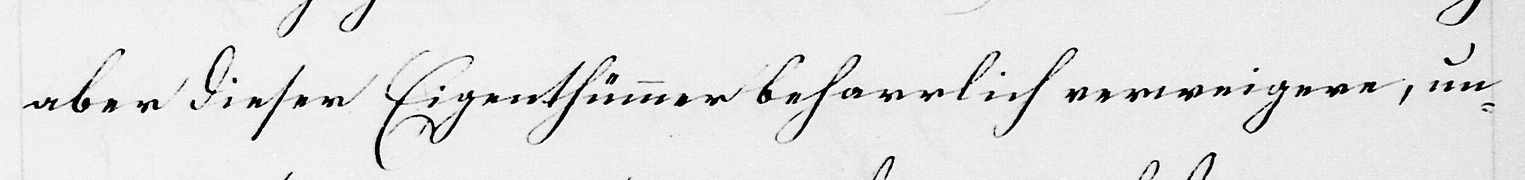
aber dieser Eigenthümmer beharrlich verweigere, un¬
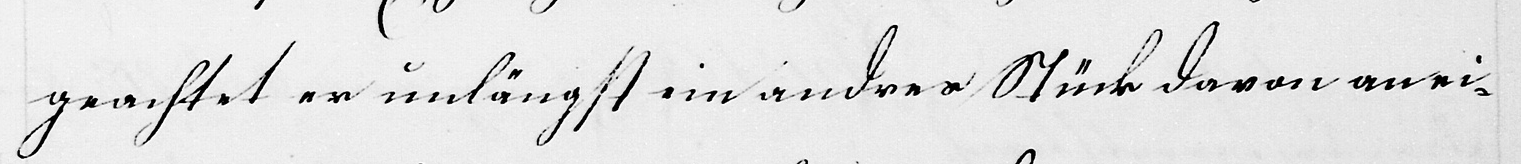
geachtet er unlängst ein andres Stück davon an ei¬
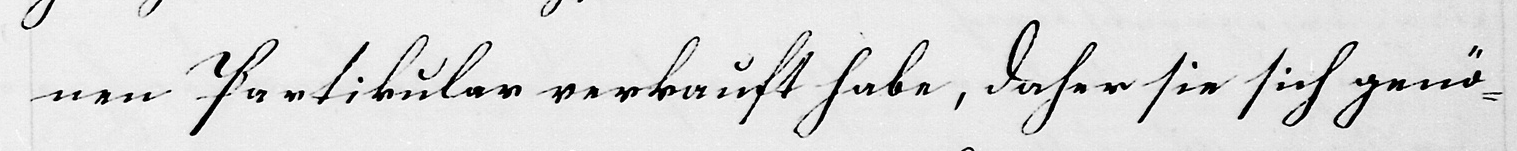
nen Partikular verkauft habe, daher sie sich genö¬
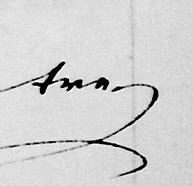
son¬
